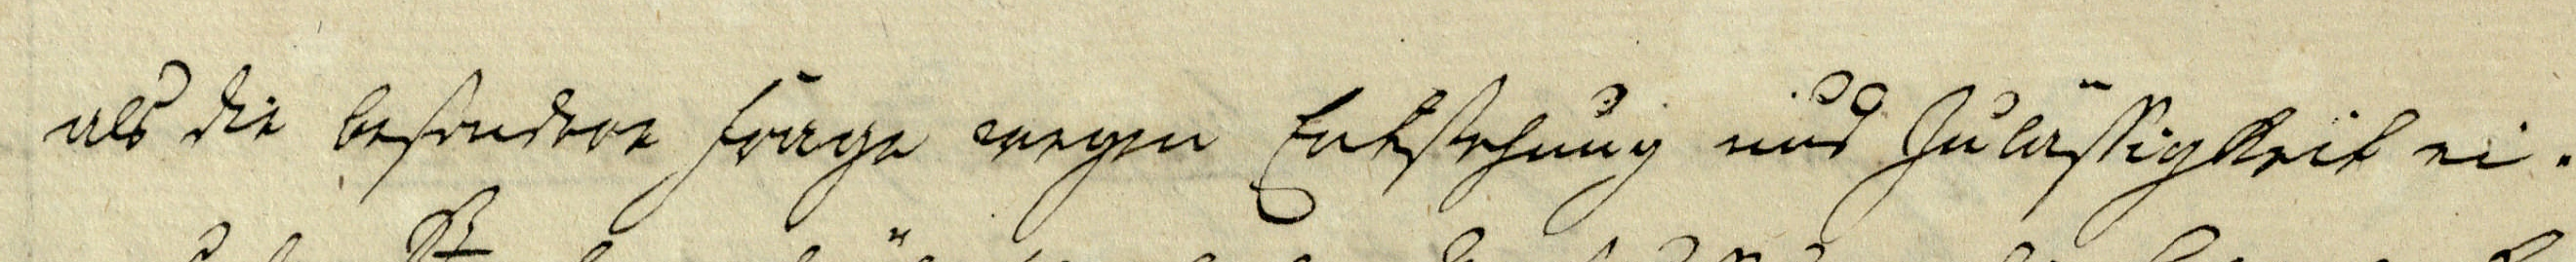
als die besondere Frage wegen Entstehung und Zulässigteit ei¬
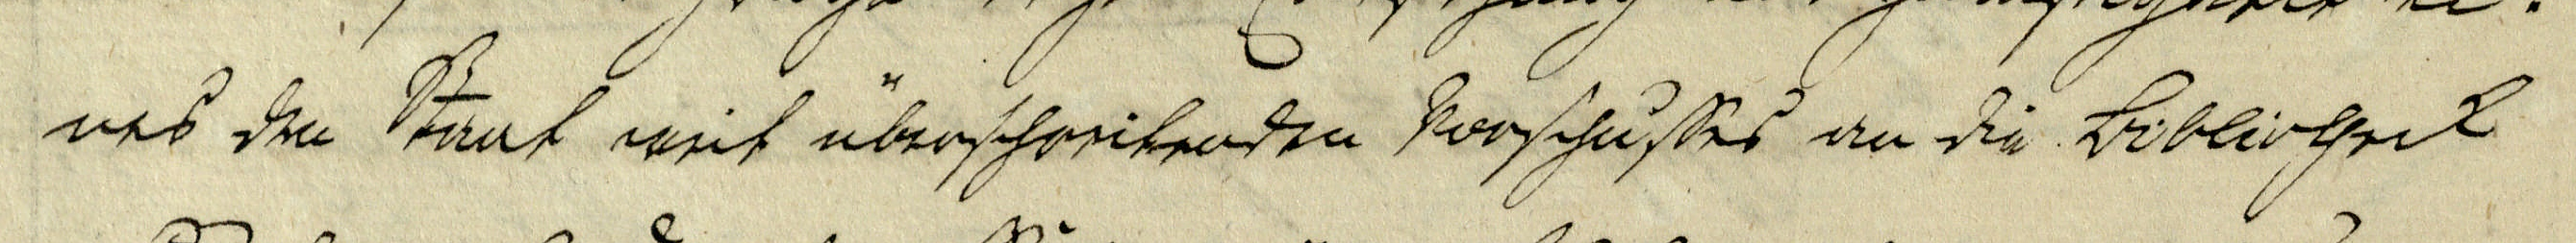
nes den Staat weit überschreitenden Vorschusses an die Bibliotheck
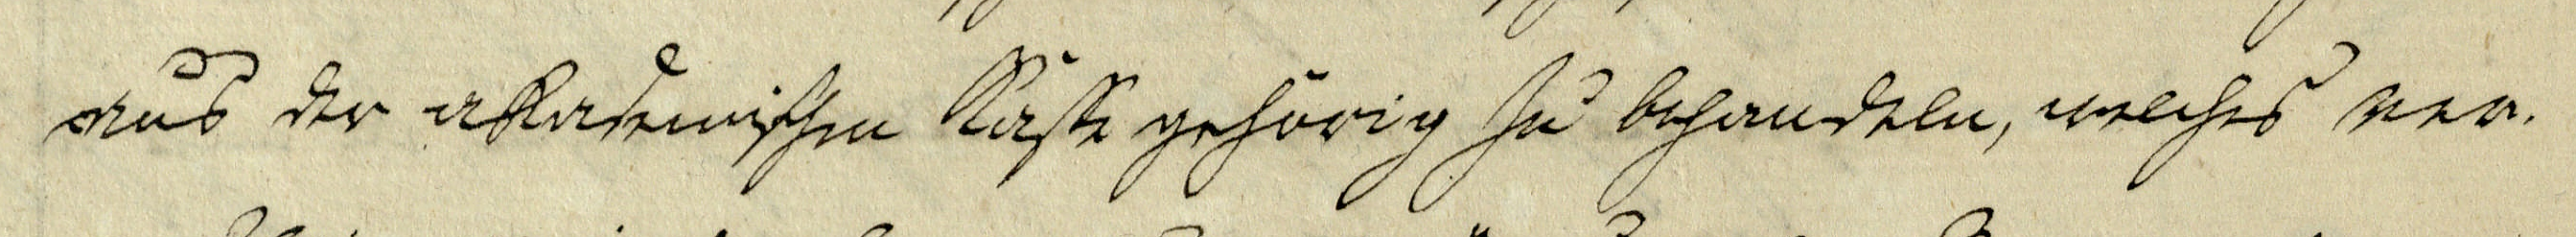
aus der akademischen Kasse gehörig zu behandeln, welches ver¬
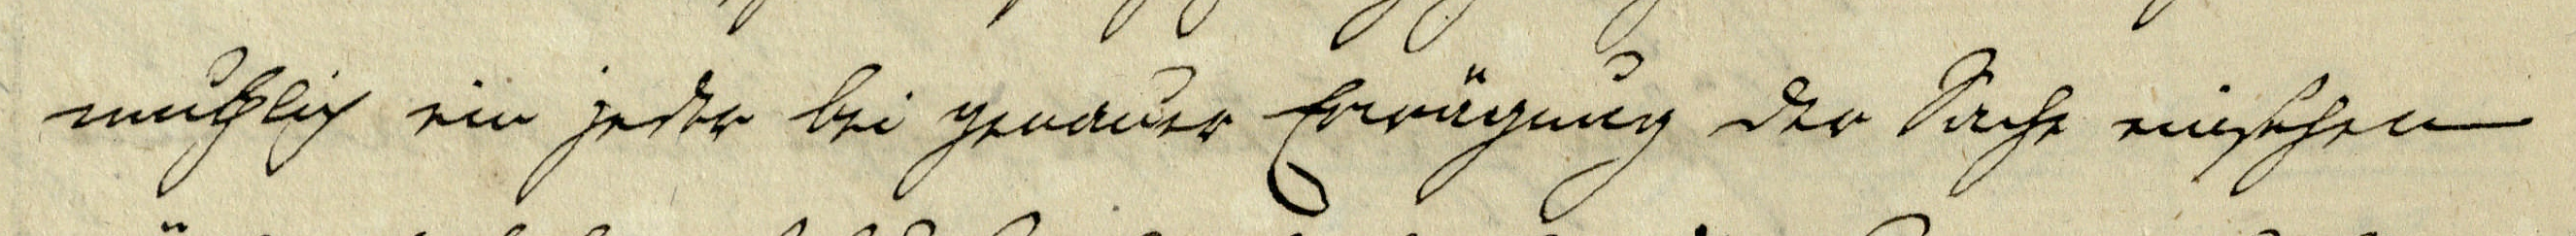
muthlich ein jeder bei genauer Erwägung der Sache einsehen
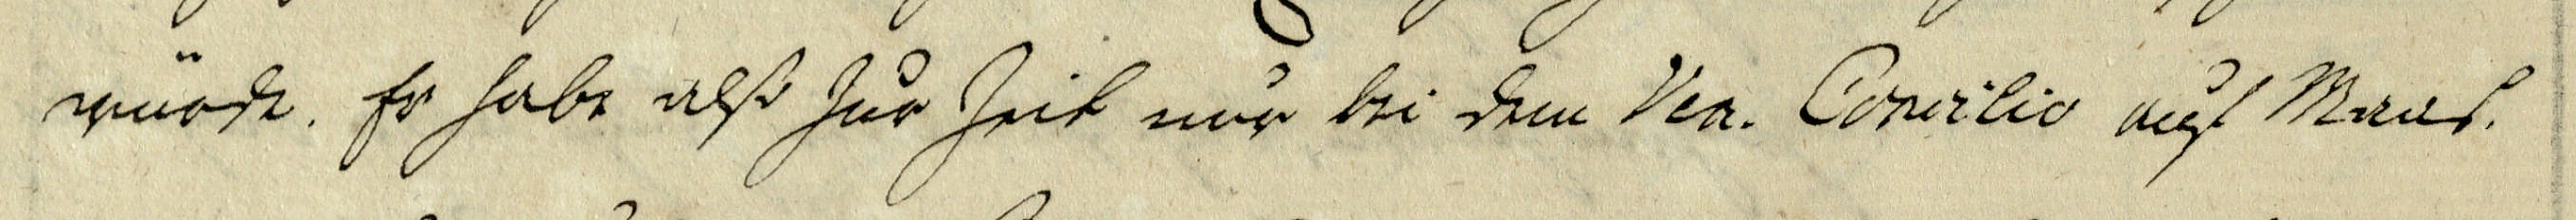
würde. Er habe also zur Zeit nur bei dem Ven. Concilio auf Maas¬
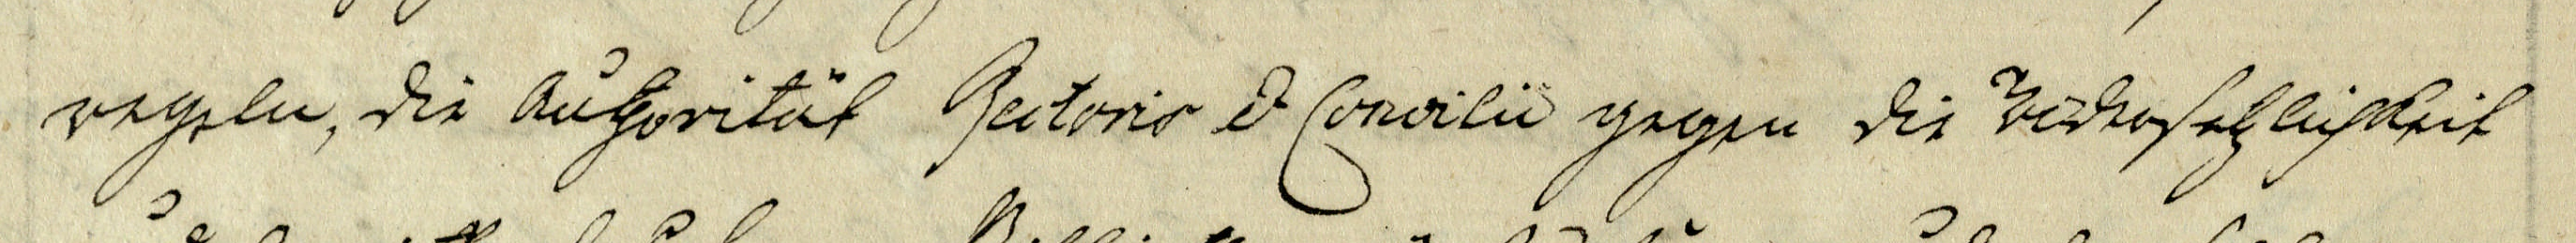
regeln, die Authorität Rectoris et Concilii gegen die Widersetzlichkeit
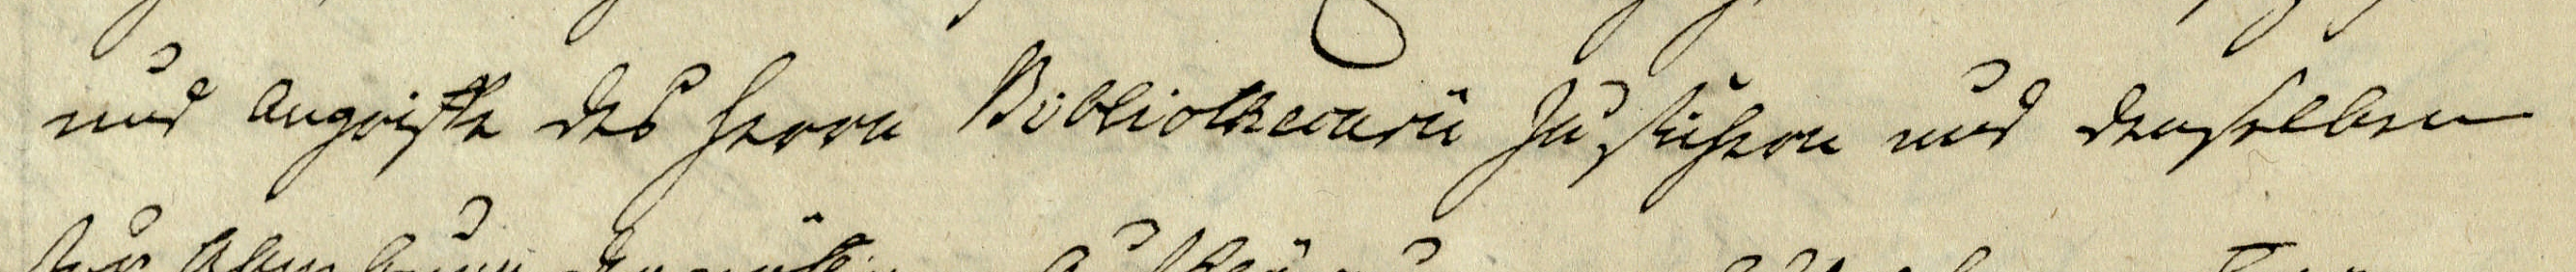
und Angriffe des Herrn Bibliothecarii zu sichern und denselben
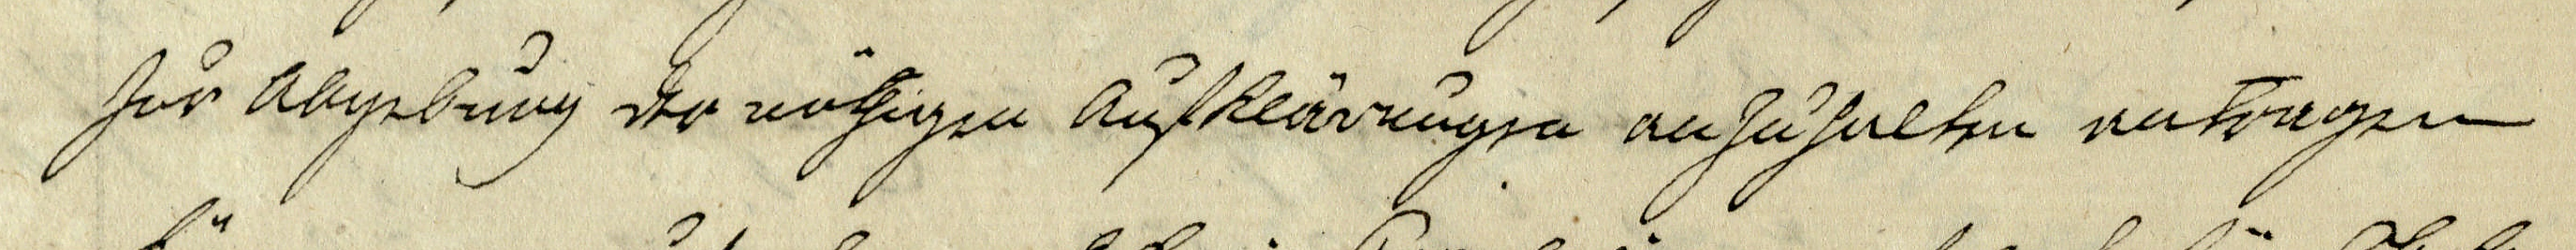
zur Abgebung der nöthigen Aufklärungen anzuhalten antragen
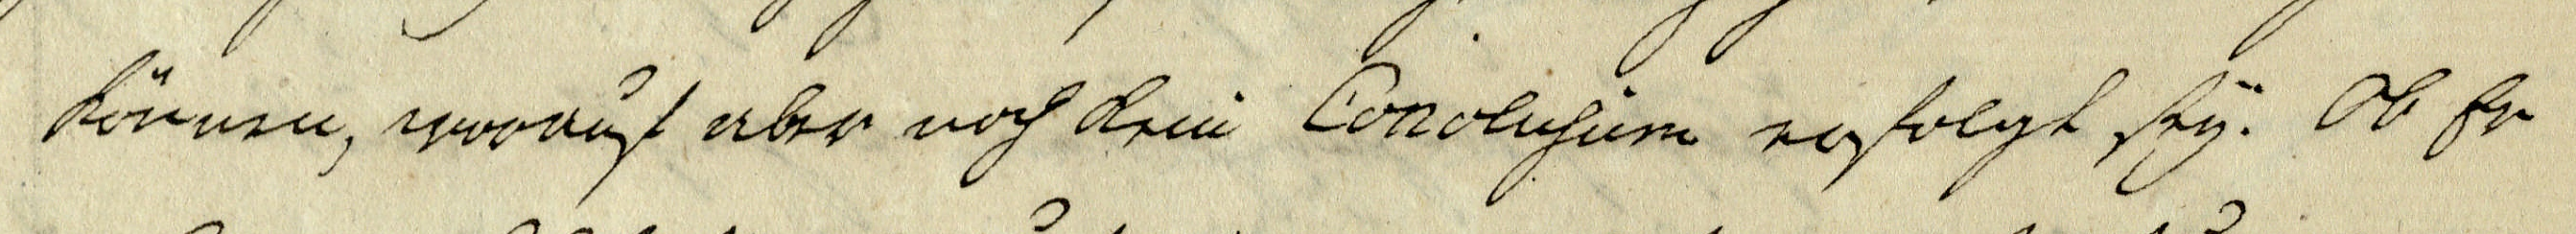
können, worauf aber noch kein Conclusum erfolgt seÿ. Ob Er
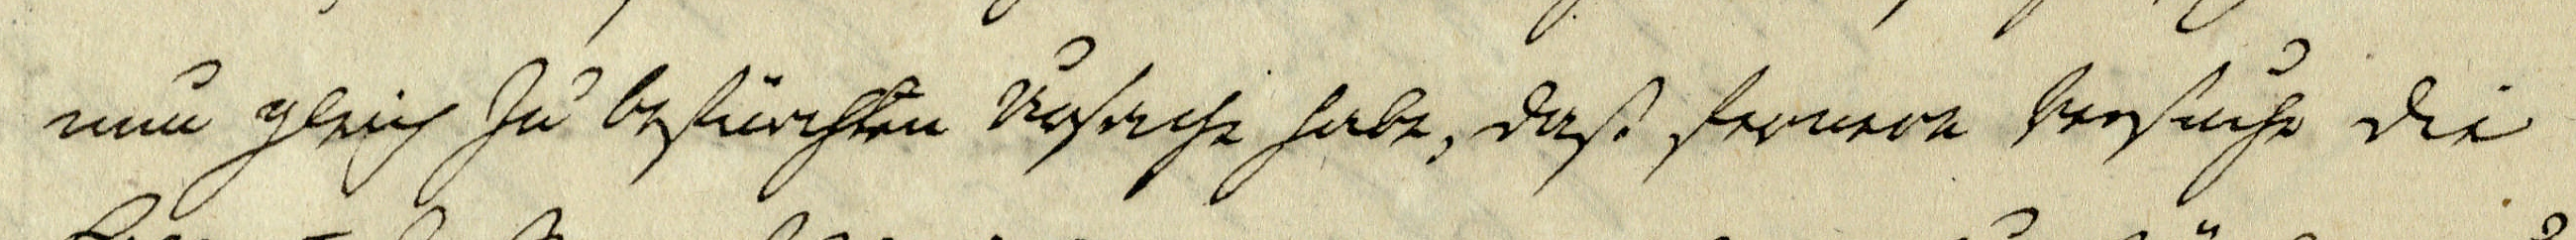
nun gleich zu befürchten Ursache habe, daß fernere Versuche die
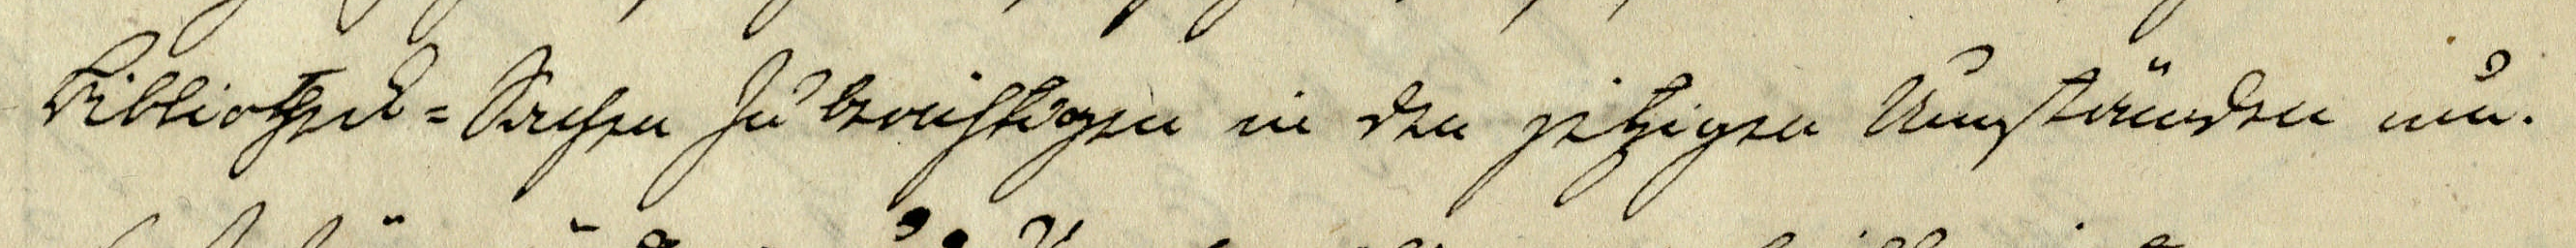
Bibliothek -Sachen zu berichtigen in den jetzigen Umständen um¬
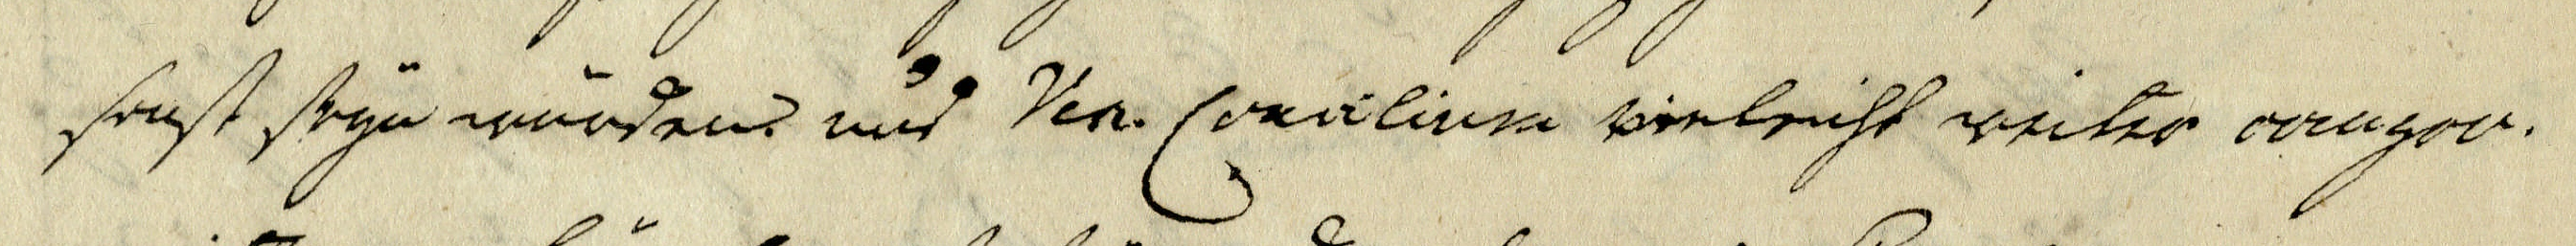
sonst seÿn würden und Ven. Concilium vieleicht weiter compro¬
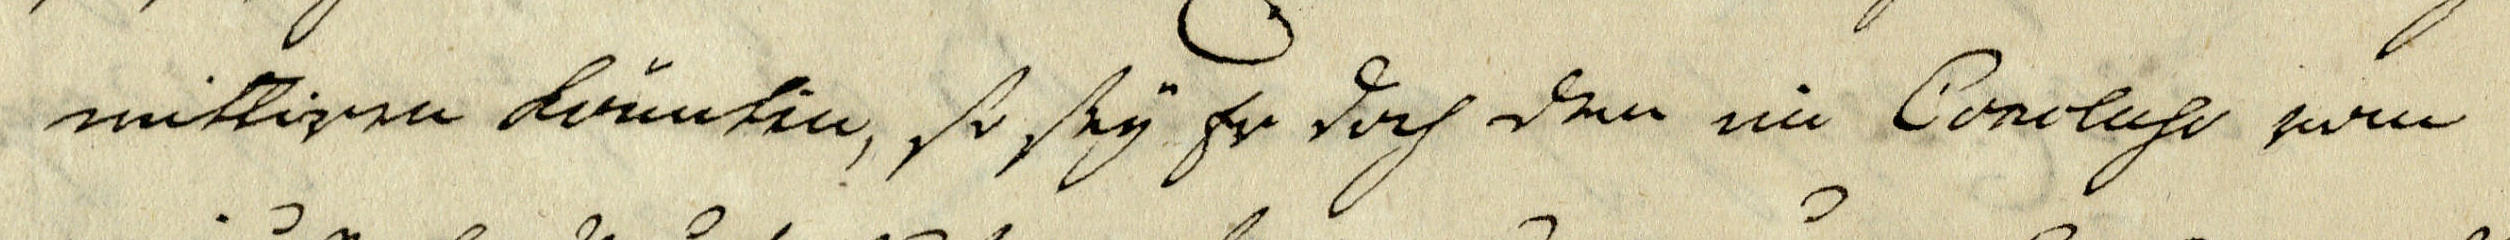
mittiren könnten, so seÿ Er doch dem im Concluso vom
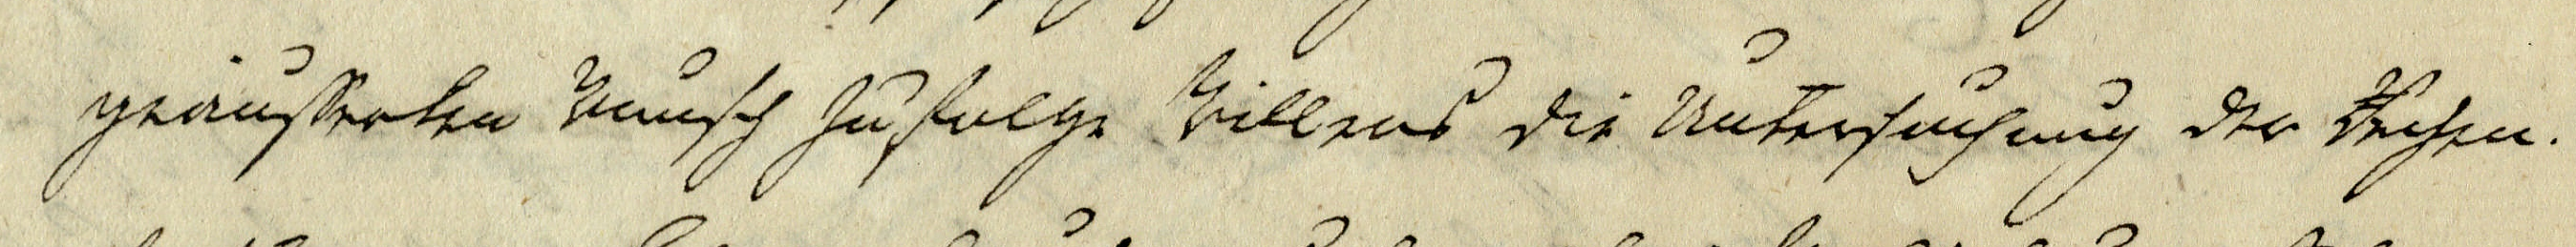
geäusserten Wunsch zufolge Willens die Untersuchung der Rechen¬
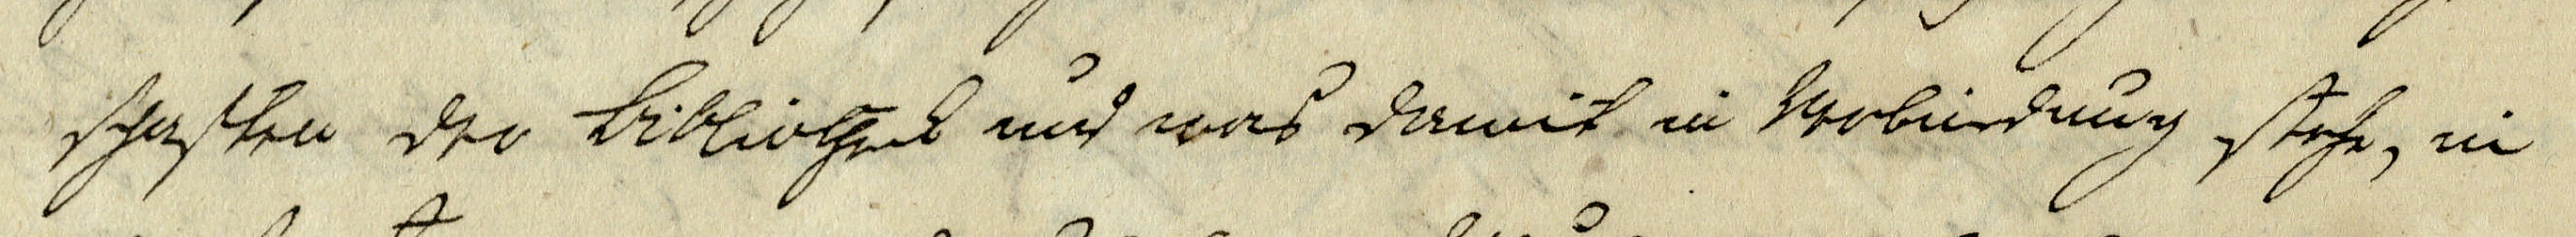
schaften der Bibliothek und was damit in Verbindung stehe, in
